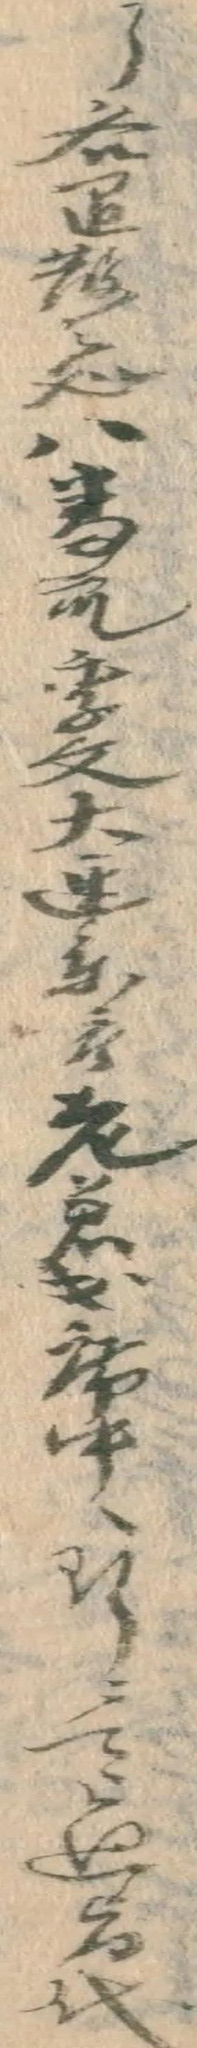了各退散之処八番衆季文大遅参ニ付老若出席中へ断ニ可被廻旨代
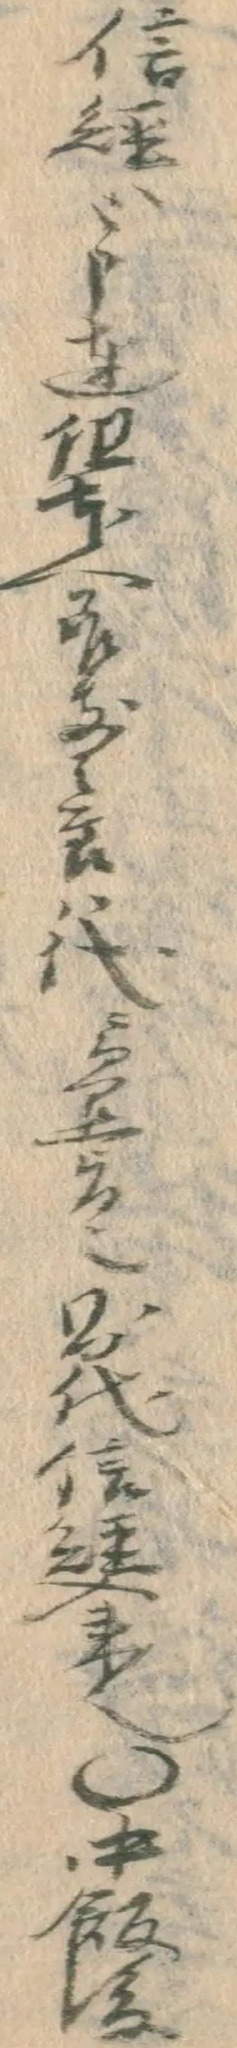信経ヘ被申達但本人差支之節ハ代ニ而置有之則代信経来也○中飯後
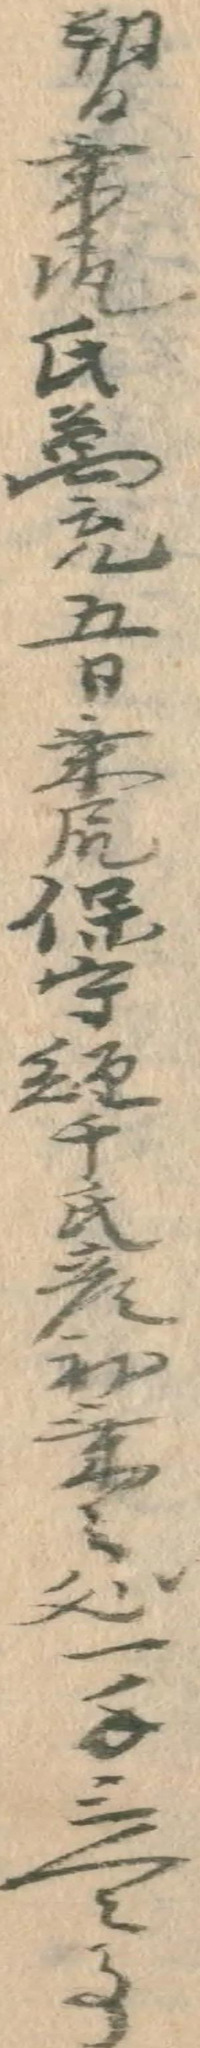朔日乗尻氏萬充五日乗尻保守経千氏彦初乗之処一手三人之事

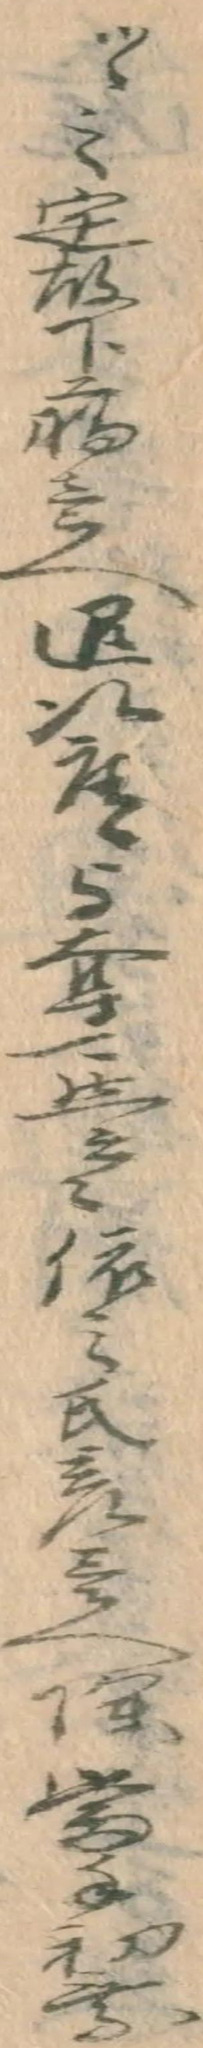ツヽ之定故下臈壱人退次座ヘ与奪可然云々依之氏彦壱人除當手初乗
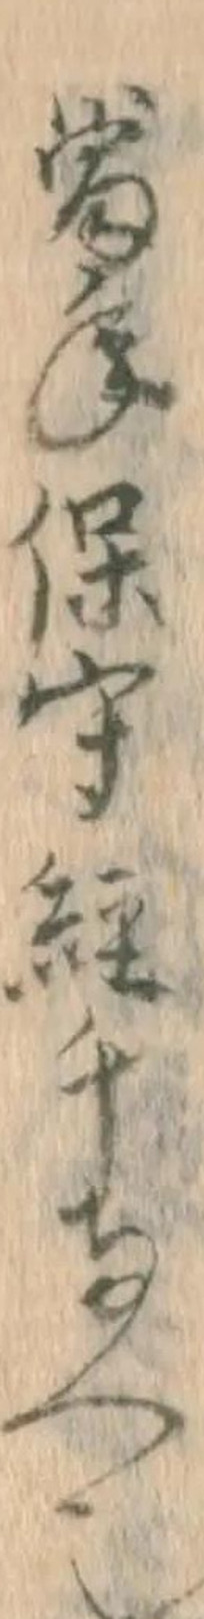當手保守経千両人也
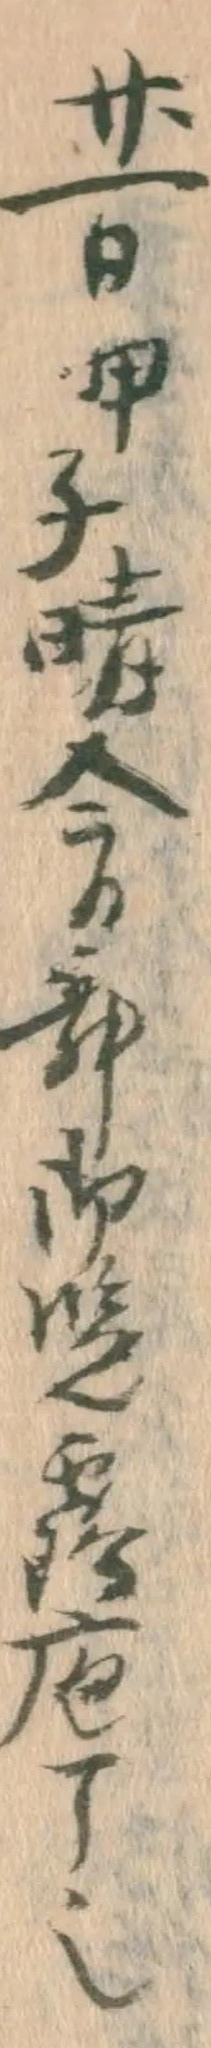廿一日甲子晴今日舞御覧鶴庖丁之
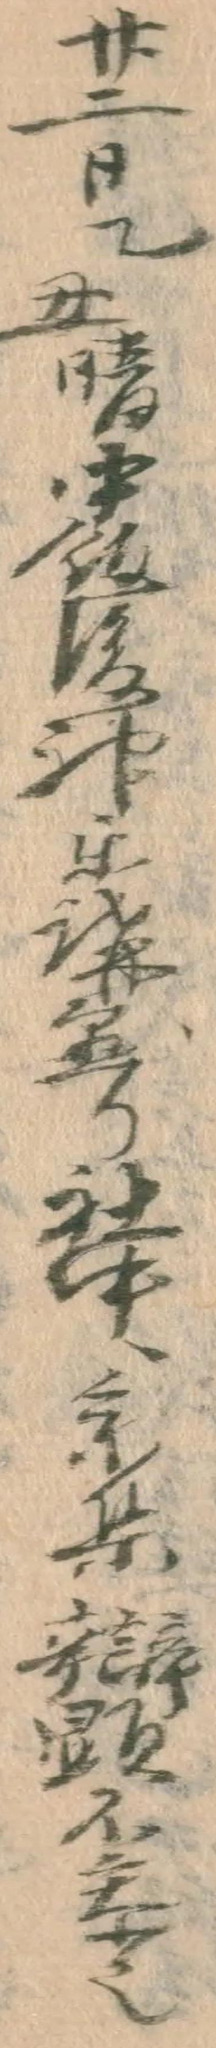廿二日乙丑晴中飯後神楽講懸り社中へ参集辨顕不参也
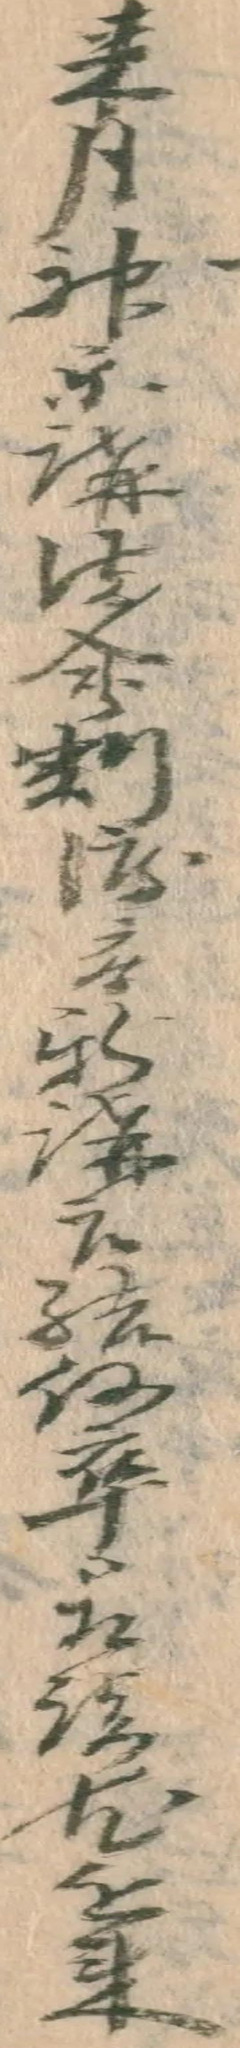来月神楽講満會割渡ニ付新講取結何卒御相詰尤近来
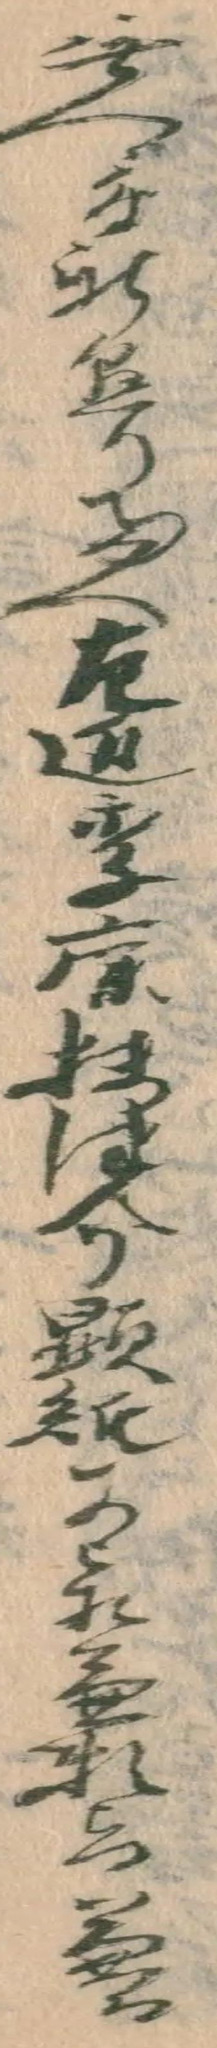無人ニ付新懸り両人左近季廉摂津介顕紀可被相兼頼旨兼而
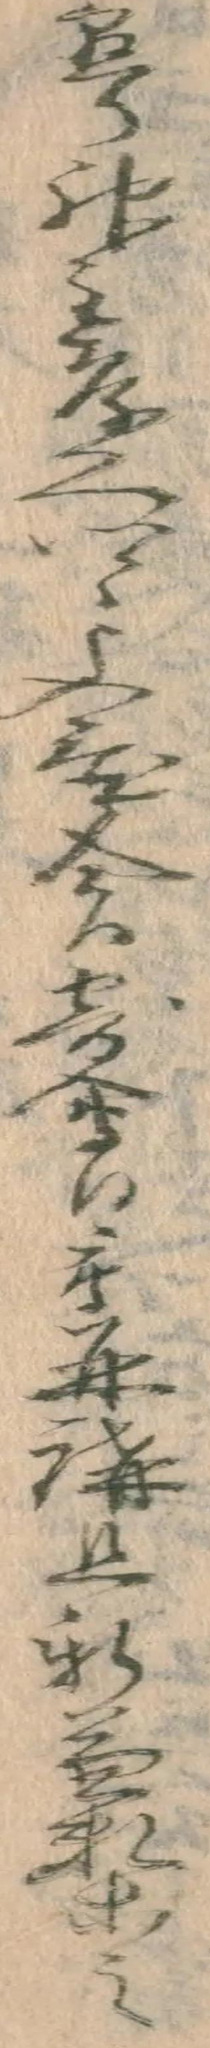懸り神主孝久卿へ申入置今日寄合日ニ付再講且新益頼等之
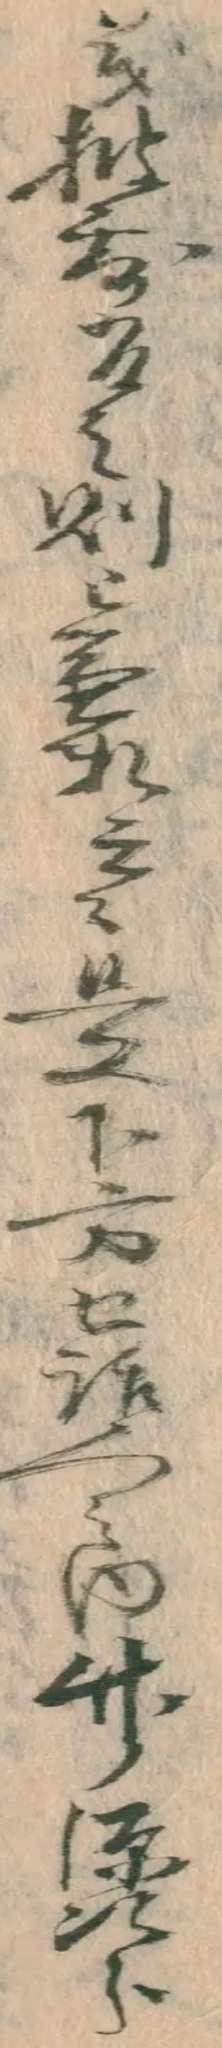義披露有之則被兼頼云々且又下方世話人之内竹ノ源次郎
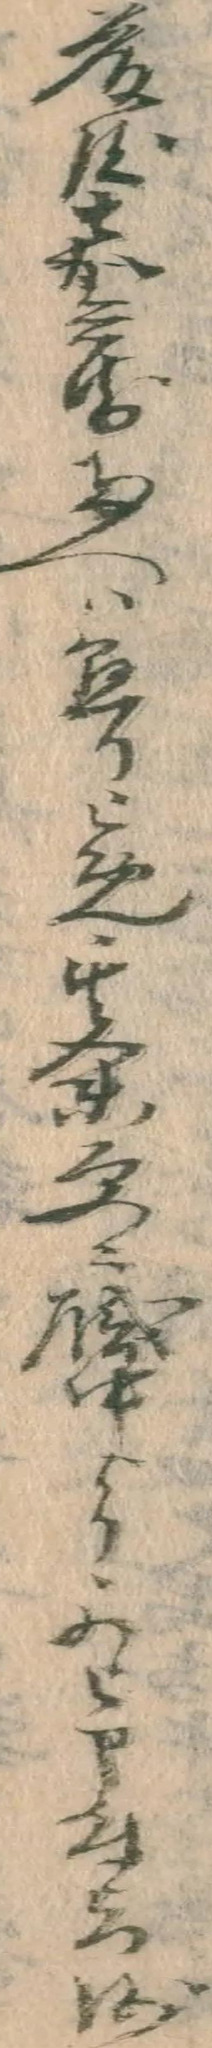藤屋嘉兵衛両人ハ懸り被免其余更二職中より可被申付旨沙
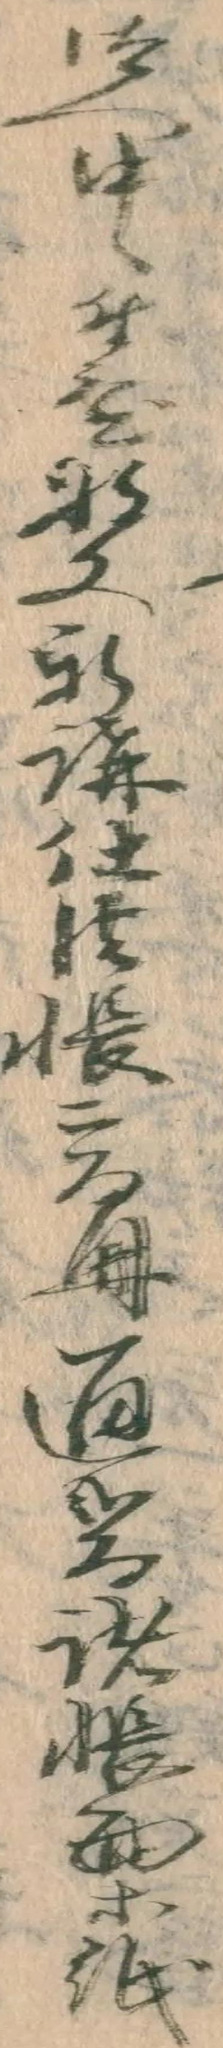汰人中へ付置将又新講仕御帳二百冊一通弐百諸帳面等紙
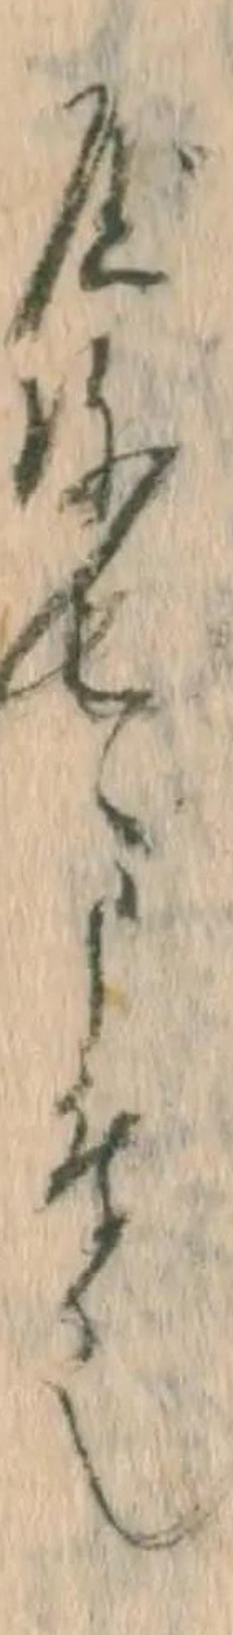屋弥七へ申付也
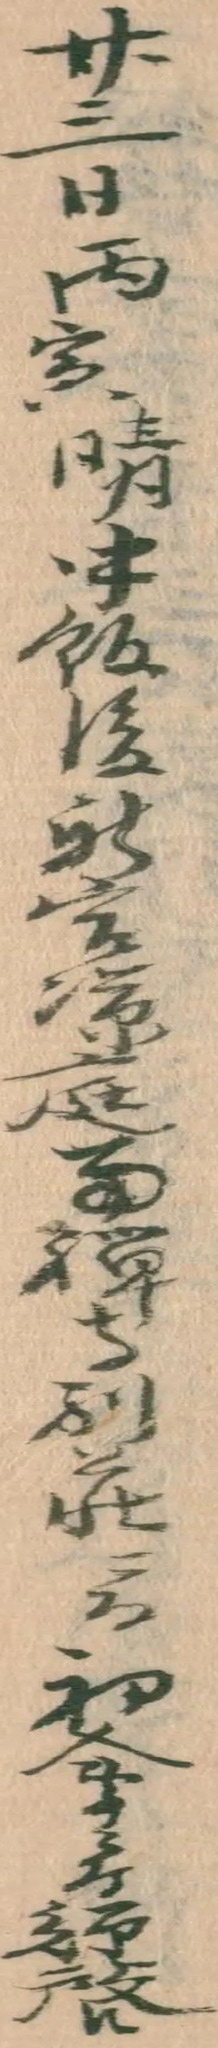廿三日丙寅晴中飯後新宮涼庭南禅寺別荘二而初會二付経啓
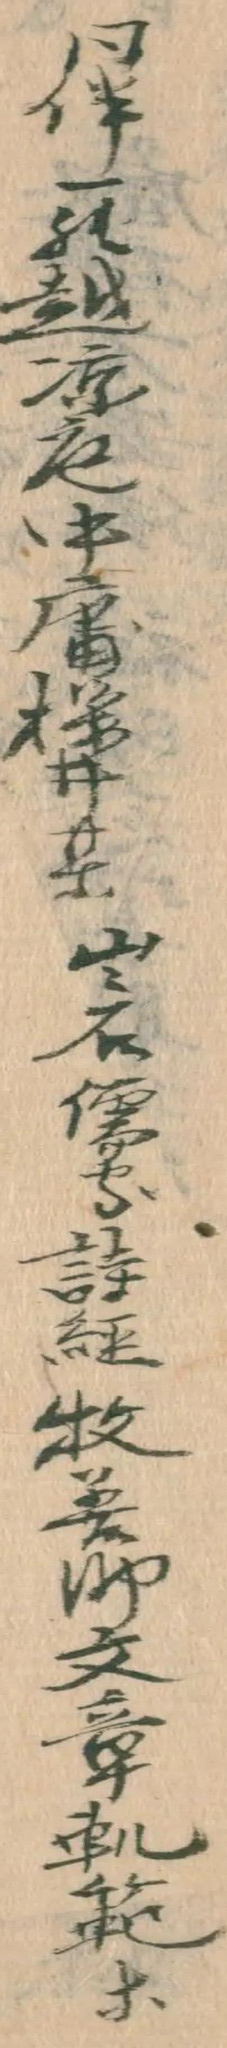同伴罷越涼庭中庸桜井某出石儒家詩経牧善助文章軌範等
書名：賀茂社記録. 第69冊
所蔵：国立国会図書館 National Diet Library, JAPAN
